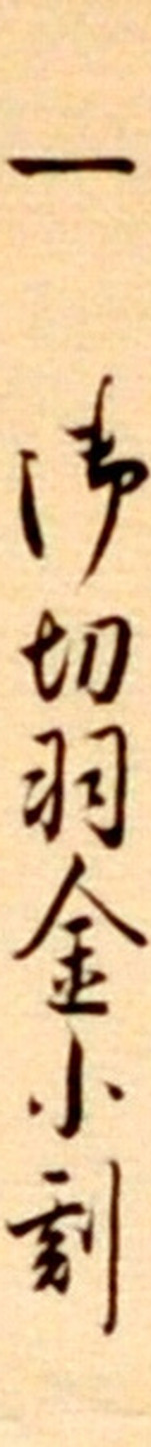一御切羽金小刻
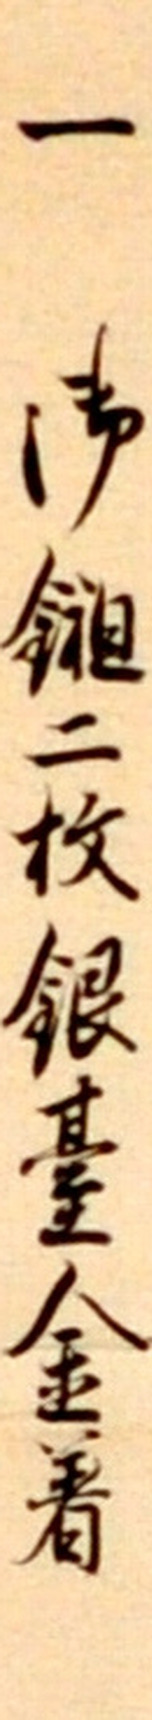一御鎺二枚銀臺金着
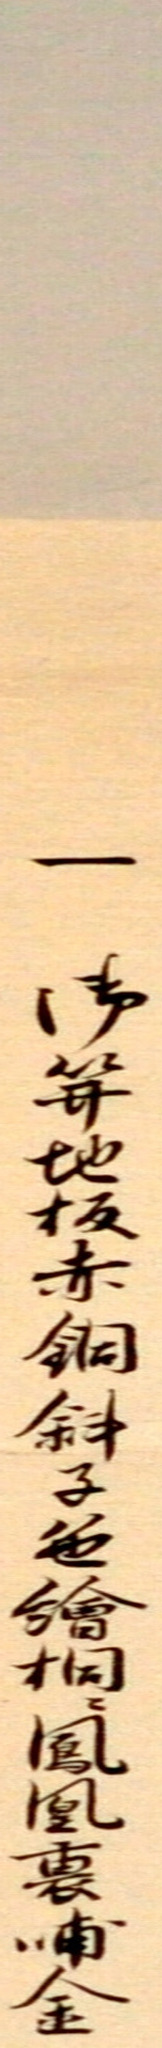一御笄地板赤銅斜子色絵桐ニ鳳凰裏哺金
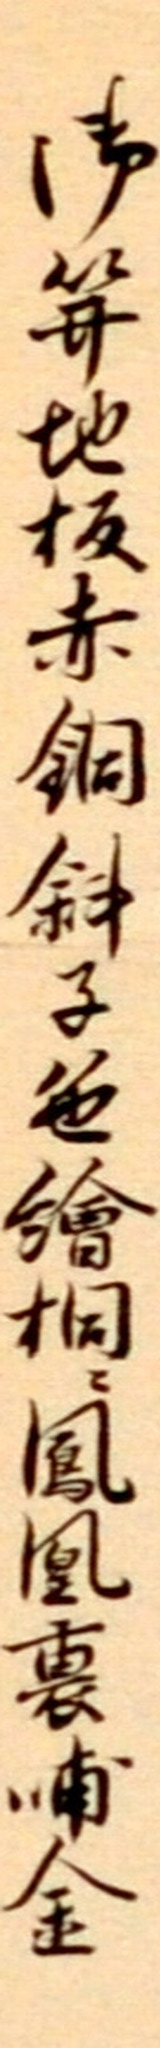一御笄地板赤銅斜子色絵桐ニ鳳凰裏哺金
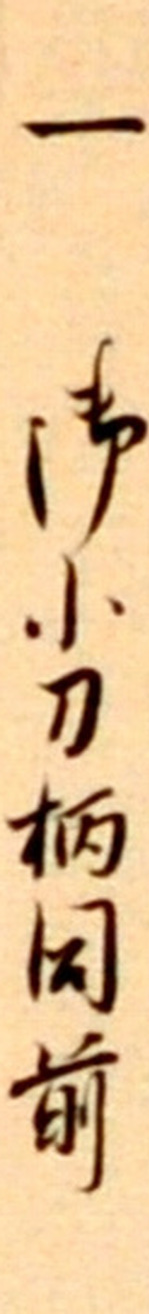一御小刀柄同前
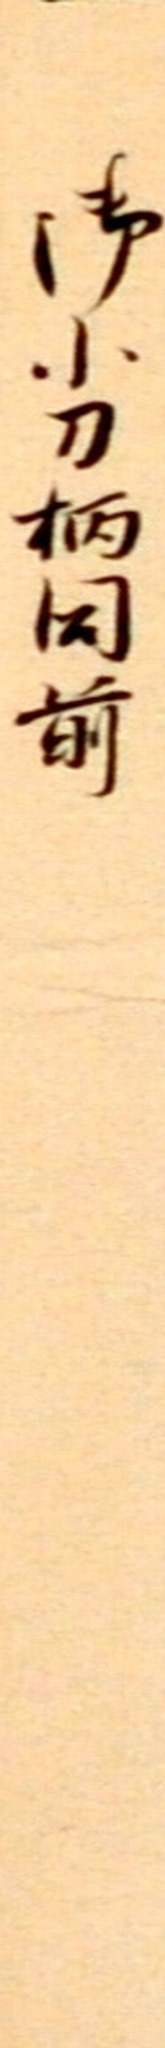一御小刀柄同前
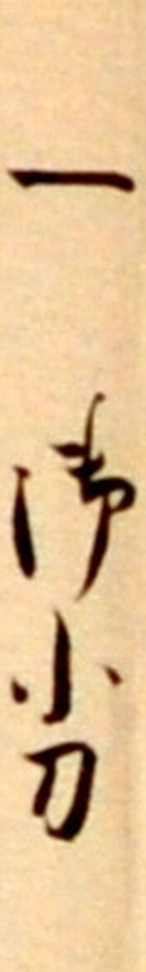一御小刀
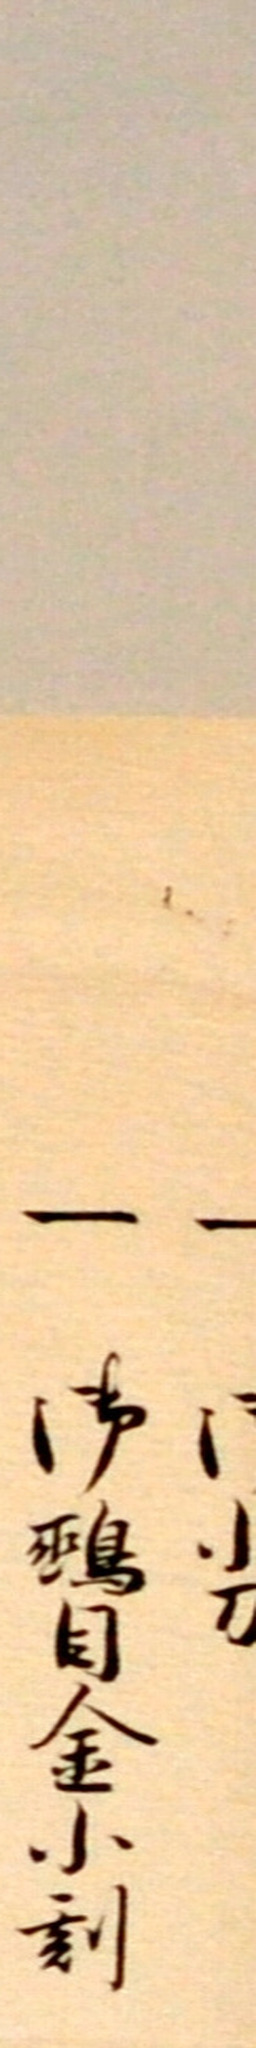一御鵐目金小判
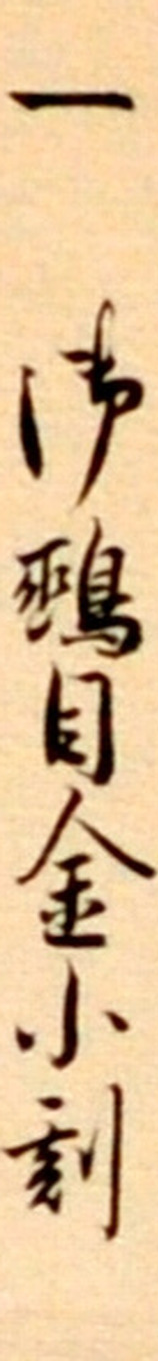一御鵐目金小判
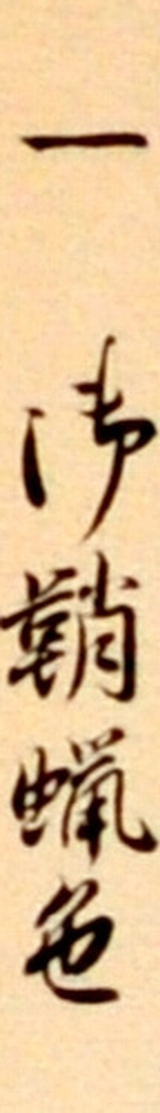一御鞘蠟色
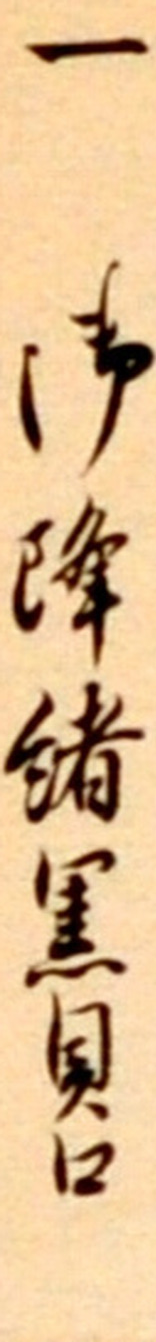一御降緒黒貝口
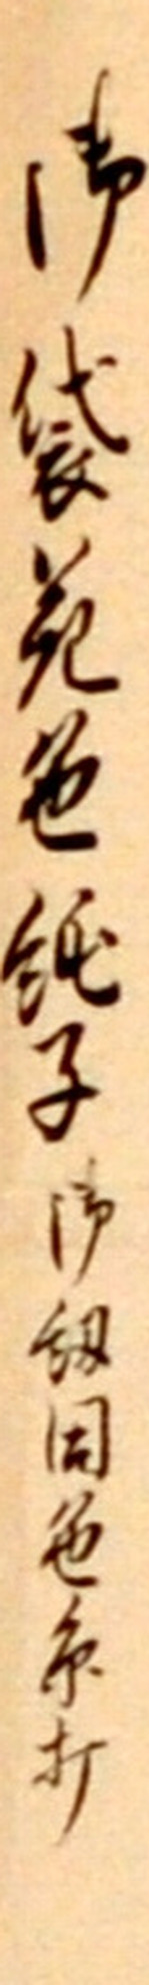一御袋花色緞子御紉萌同色糸打
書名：御刀御拵之覚
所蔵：伊那市立高遠町図書館・合同会社AMANE
